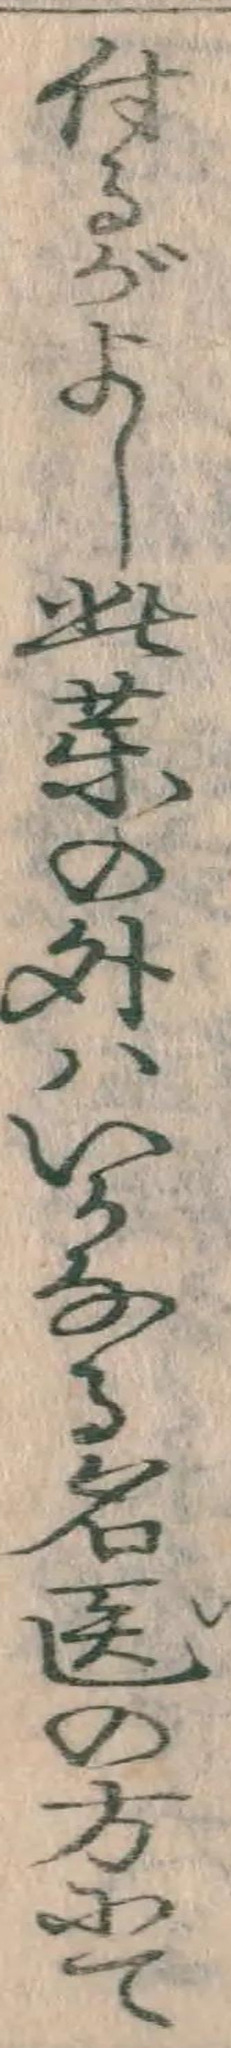付るがよし此薬の外はいかなる名医の方にて
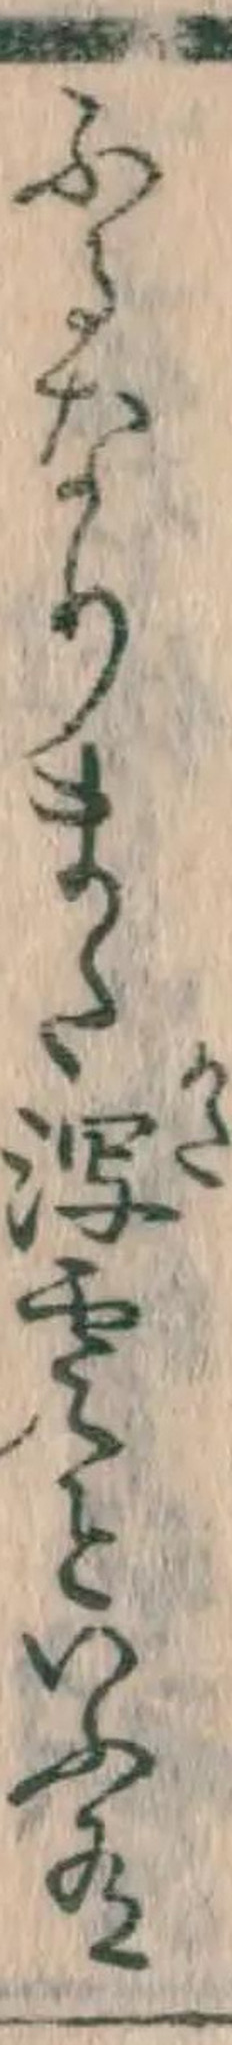ふるなりまた潟雲といふ有
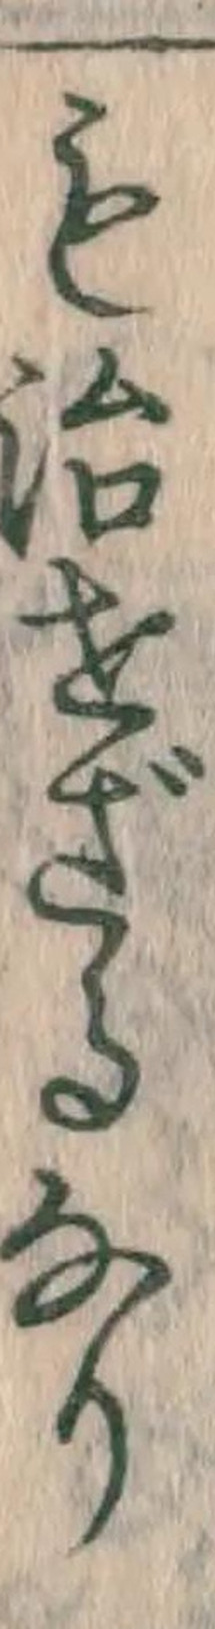も治せざるなり
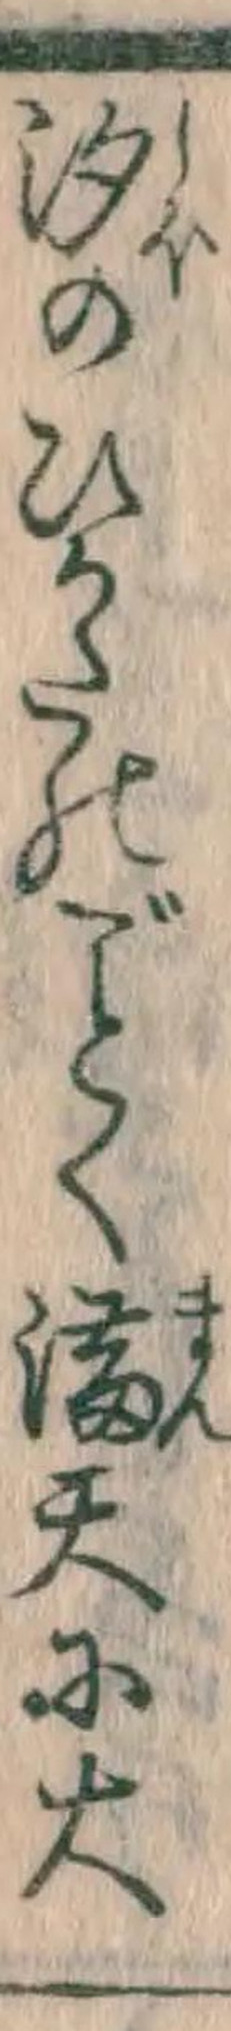汐のひかたのごとく満天に大
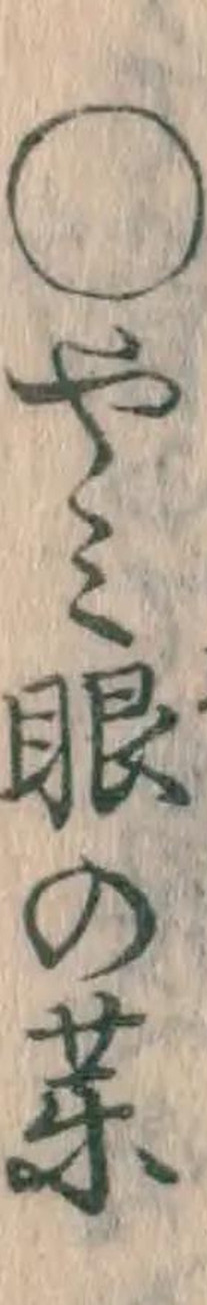○やみ眼の薬
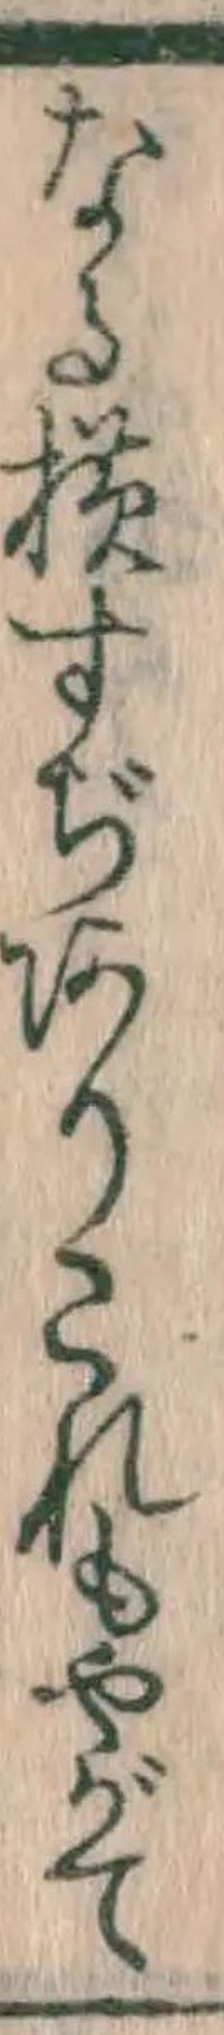なる横すぢありこれもやがて
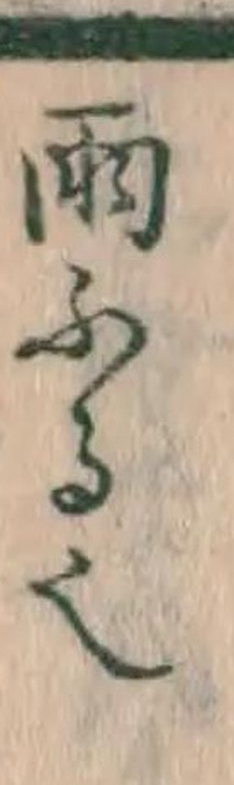雨ふる也
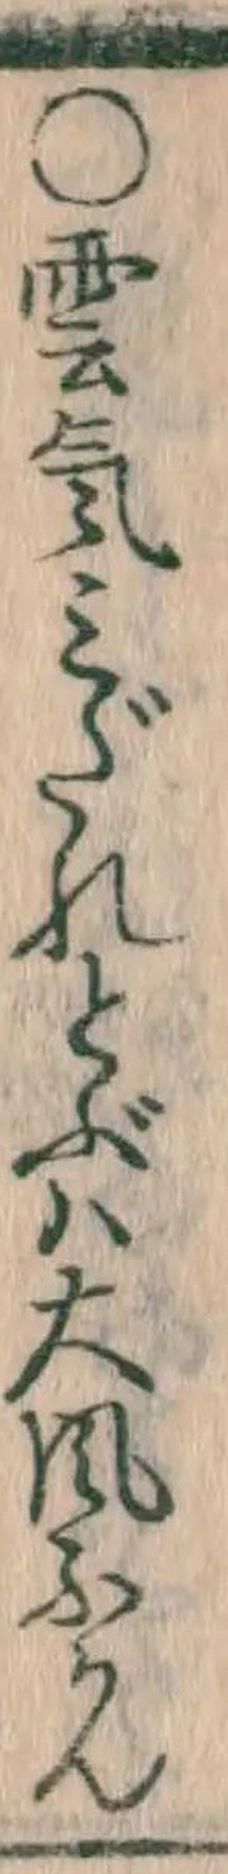○雲気みだれとぶは大風ふかん
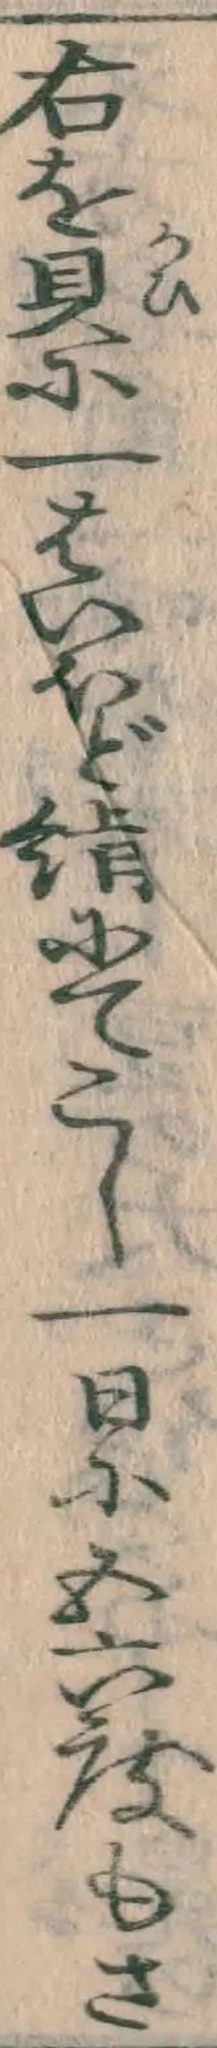右を貝に一はいほど絹にてこし一日に五六度もさ
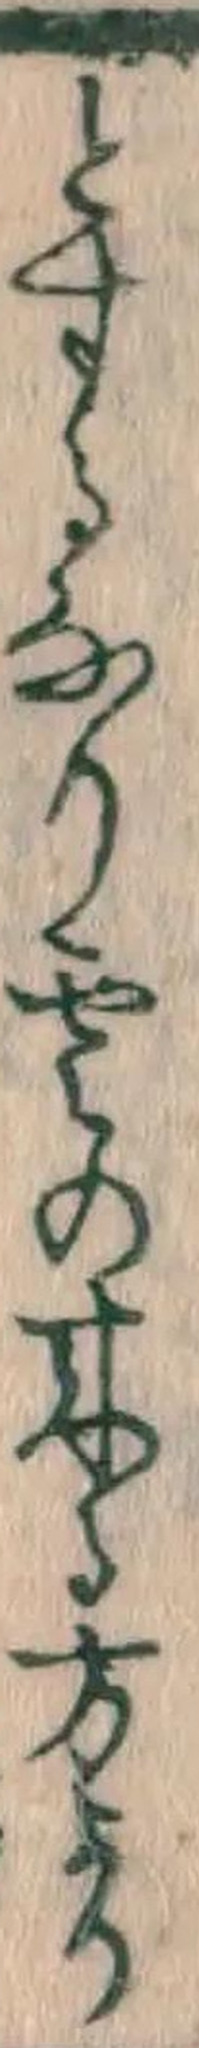とするなり雲の来る方より
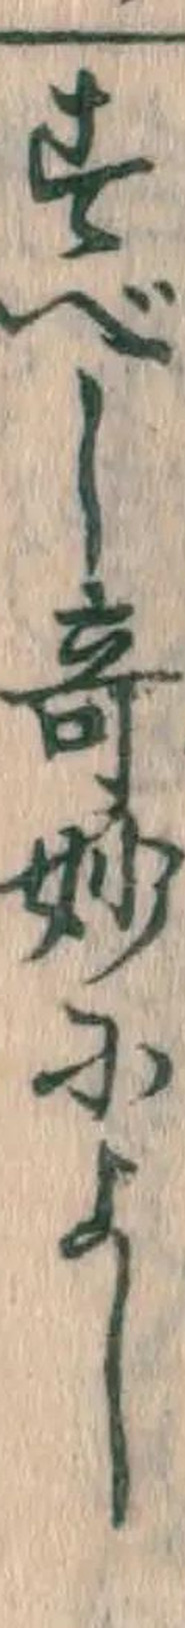すべし奇妙によし
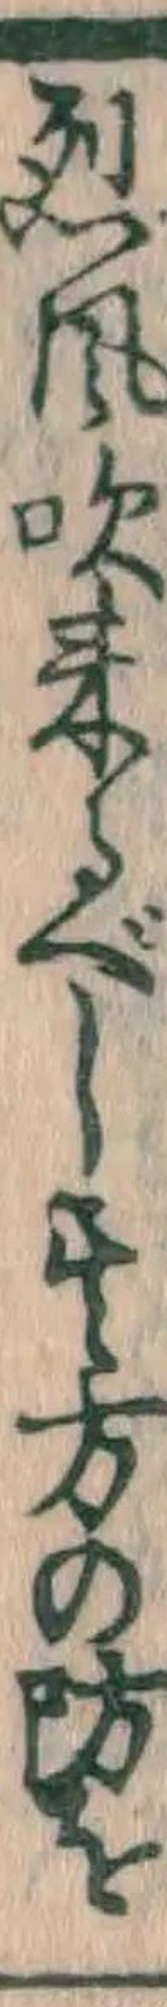烈風吹来るべし其方の防を
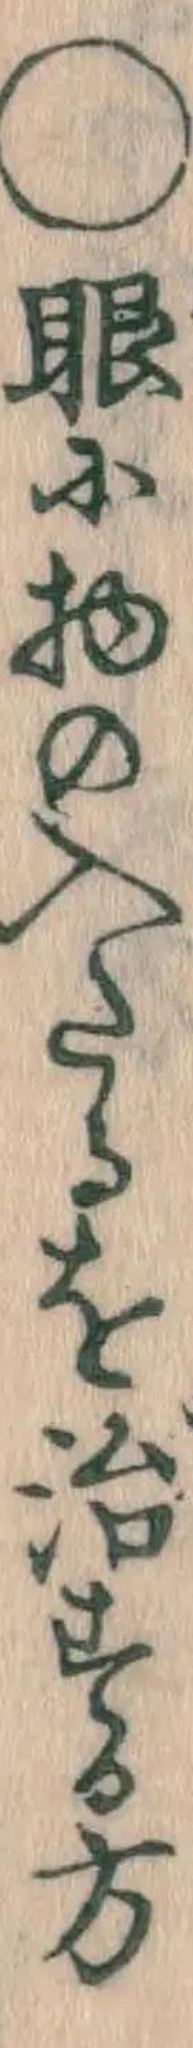○眼に物の入たるを治する方
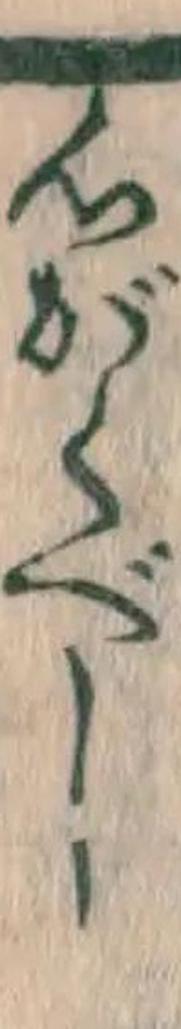心がくべし
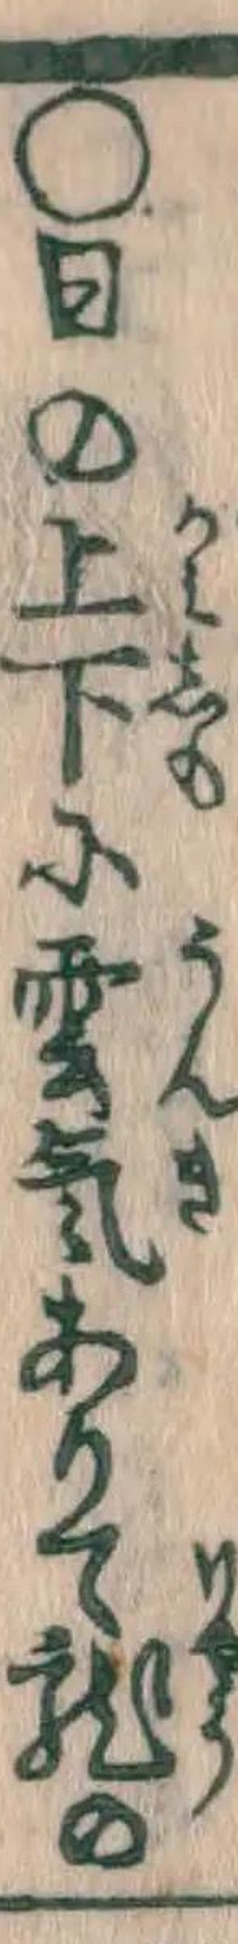○日の上下に雲気ありて竜の
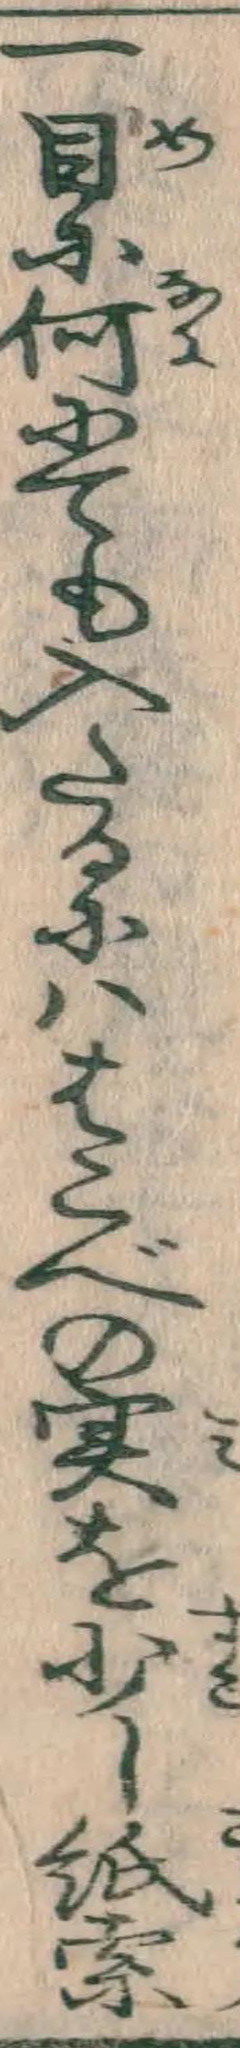一目に何にても入たるにははこべの実を少し紙索
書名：広益秘事大全 3巻. [4]
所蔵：国立国会図書館 National Diet Library, JAPAN
